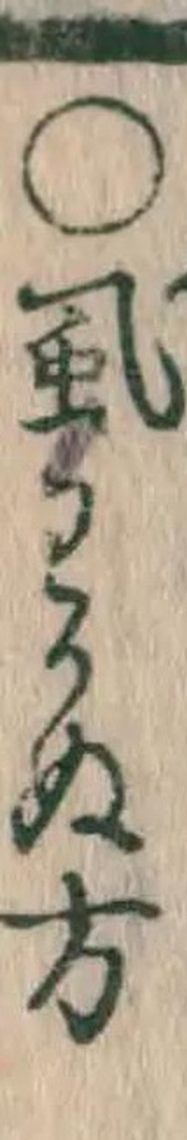○虱わかぬ方
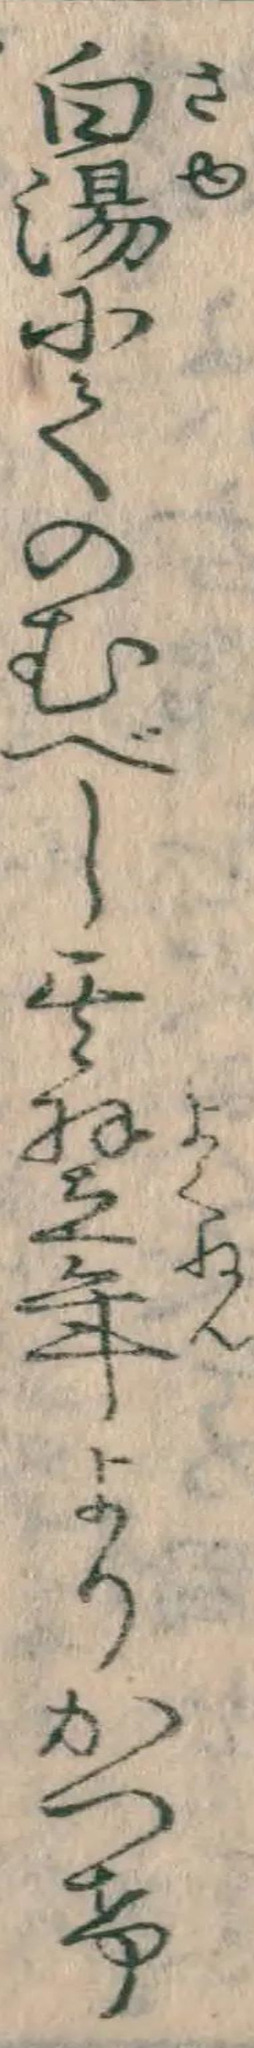白湯にてのむべし其翌年よりかつけ
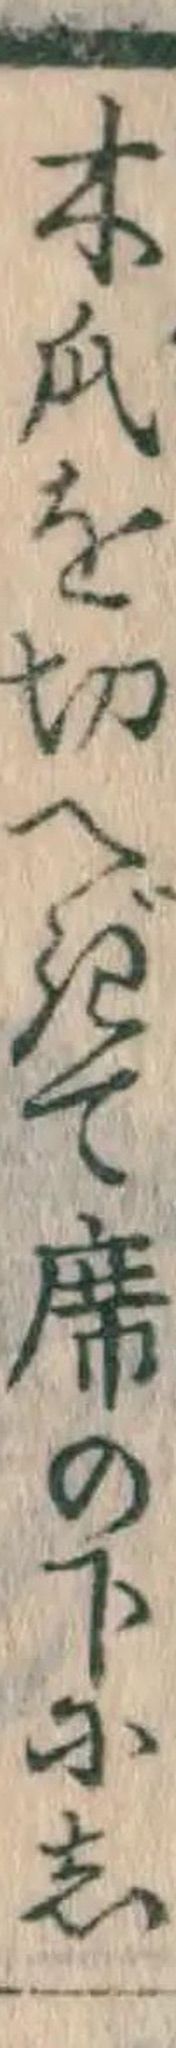木瓜を切へぎて席の下にし
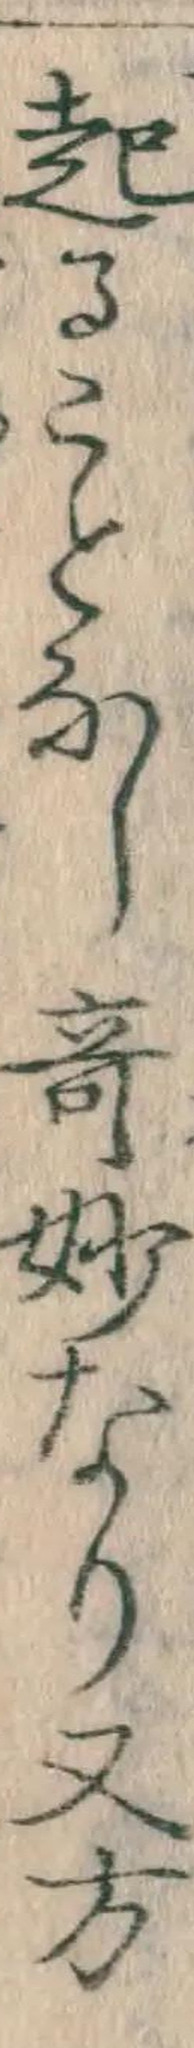起ることなし奇妙なり又方
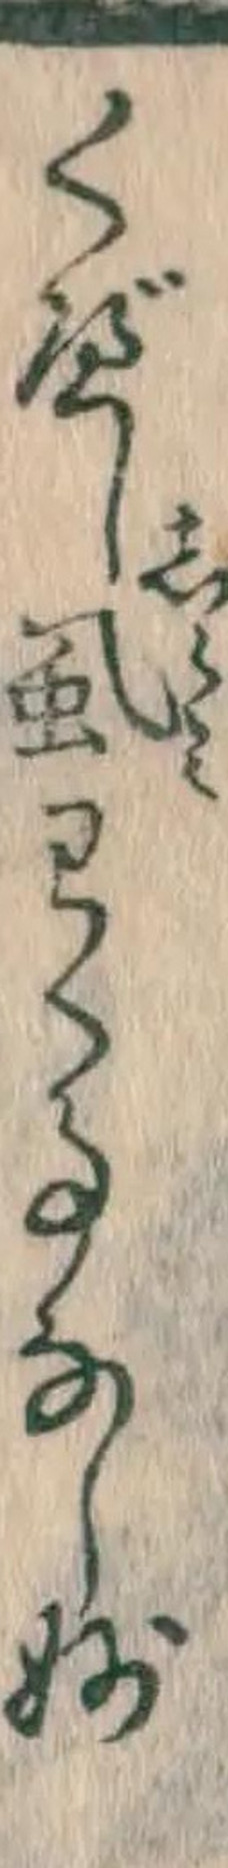くべし虱わく事なし妙
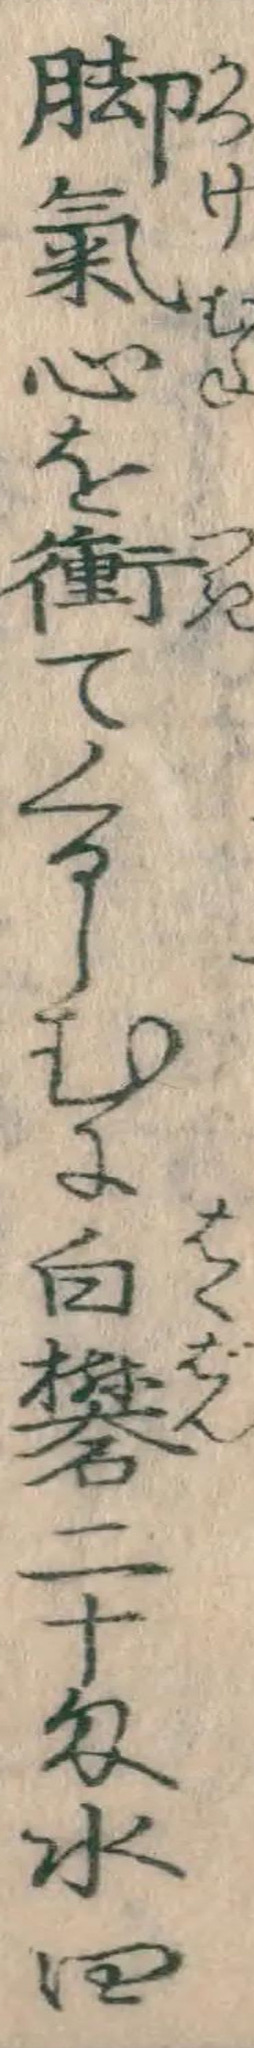脚気心を衝てくるしむに白礬二十匁水四
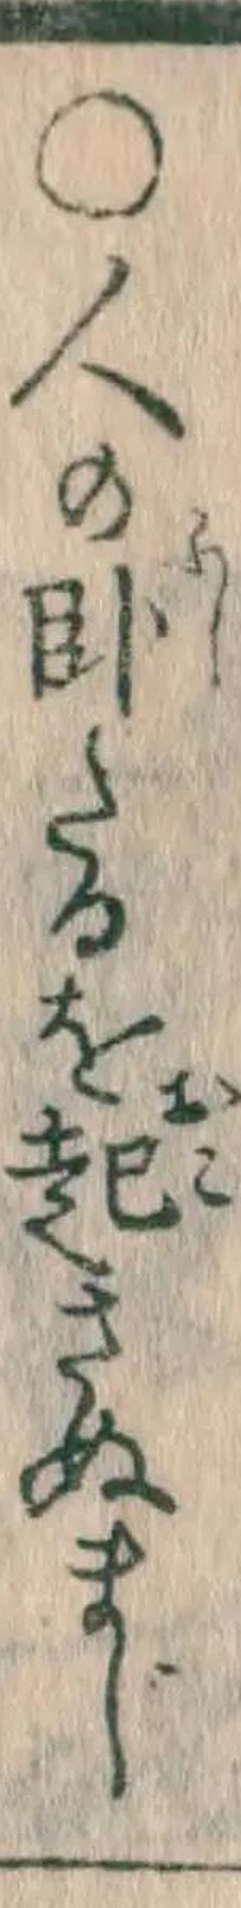○人の臥たるを起さぬまじ
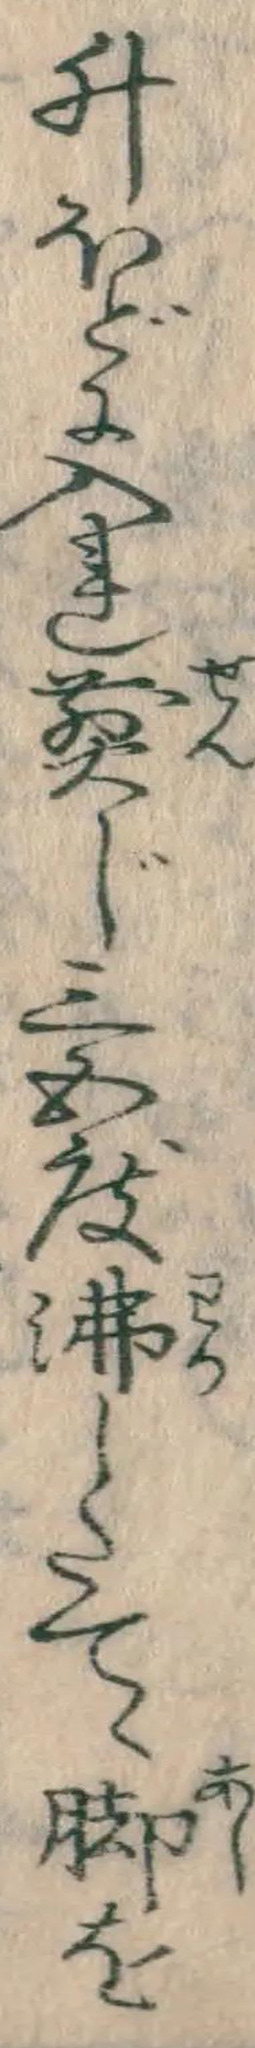升ほどに入れ煎じ三五度沸したてゝ脚を
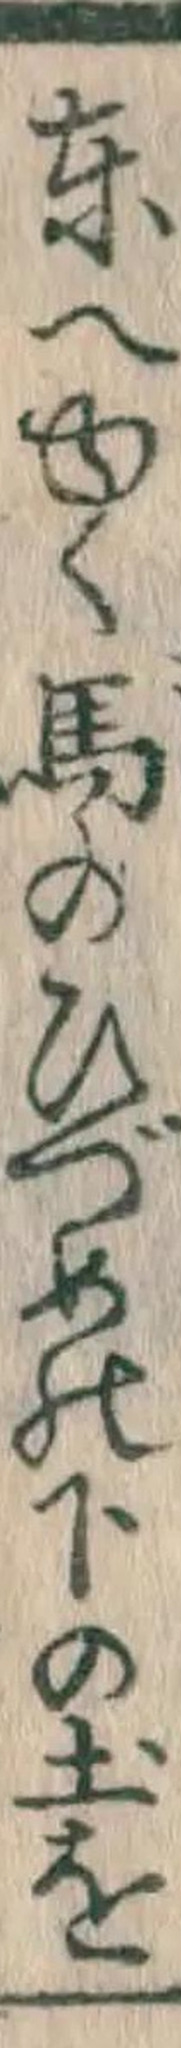東へゆく馬のひづめの下の土を
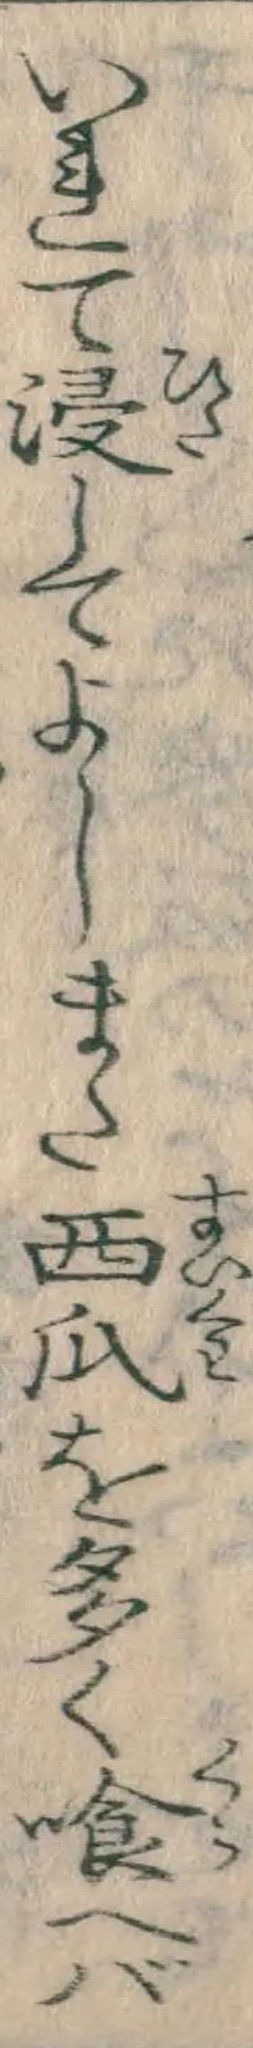いれて浸してよしまた西瓜を多く喰へば
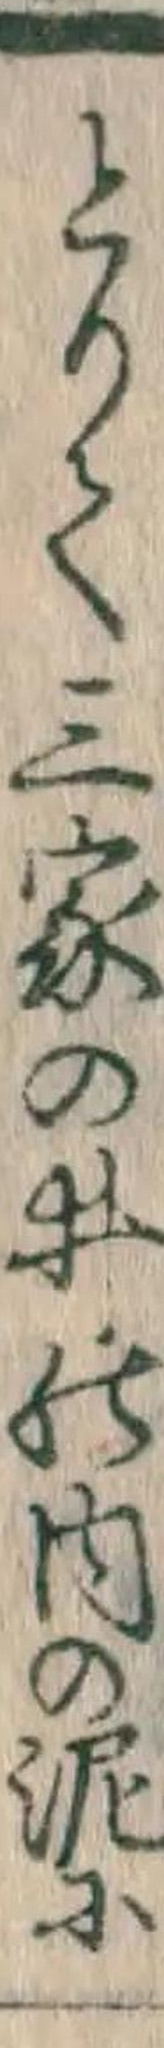とりて三家の井の内の泥に
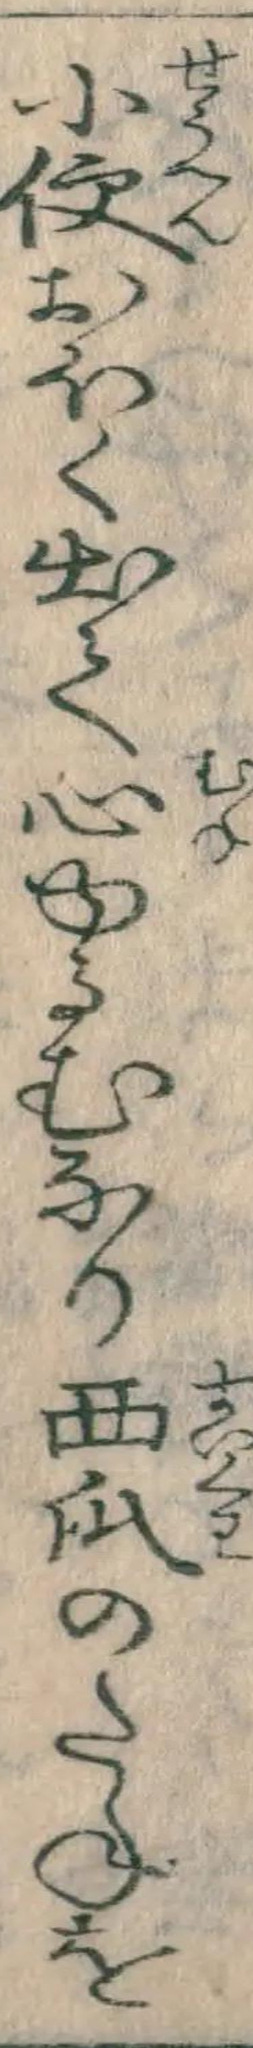小便おほく出て心ゆるむなり西瓜のたねを
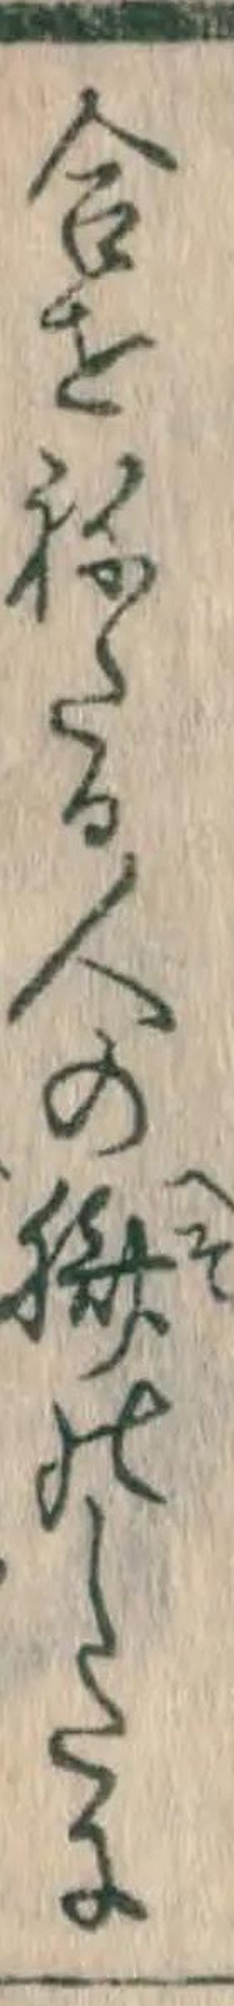合せねたる人の臍のしたに
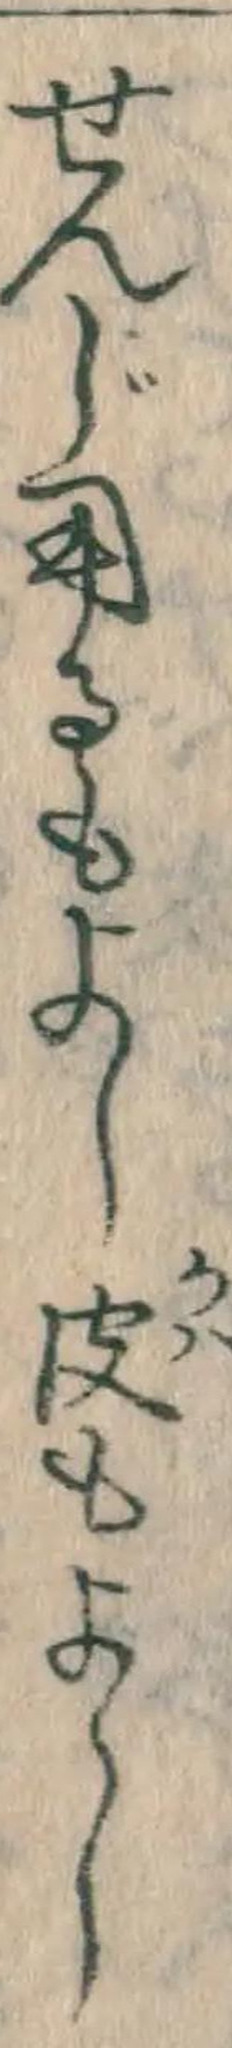せんじ用るもよし皮もよし
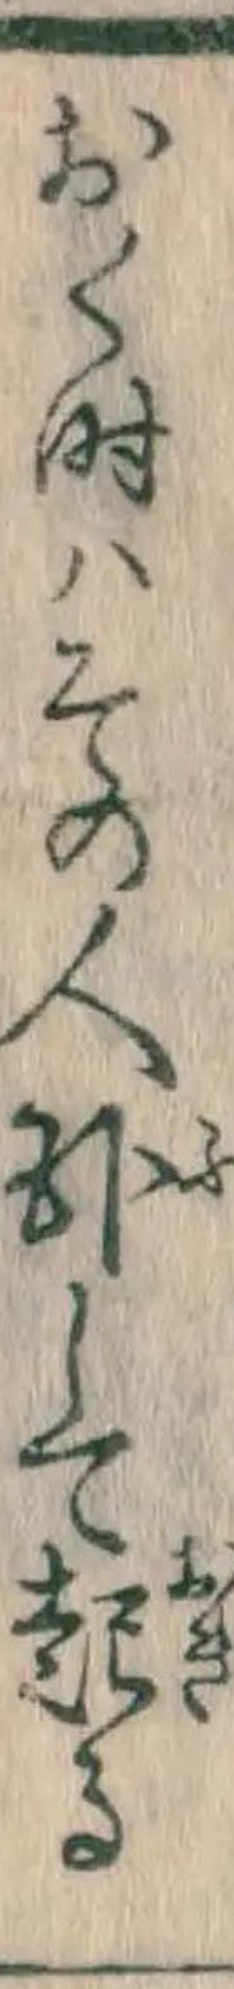おく時はその人臥して起る
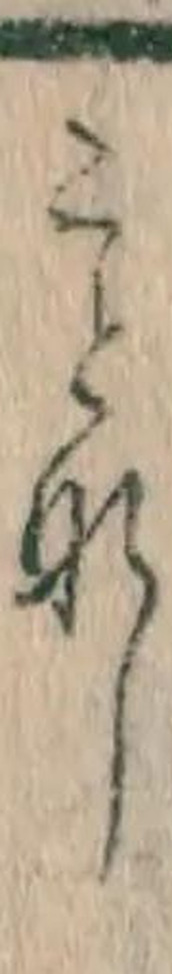ことなし
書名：広益秘事大全 3巻. [4]
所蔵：国立国会図書館 National Diet Library, JAPAN
